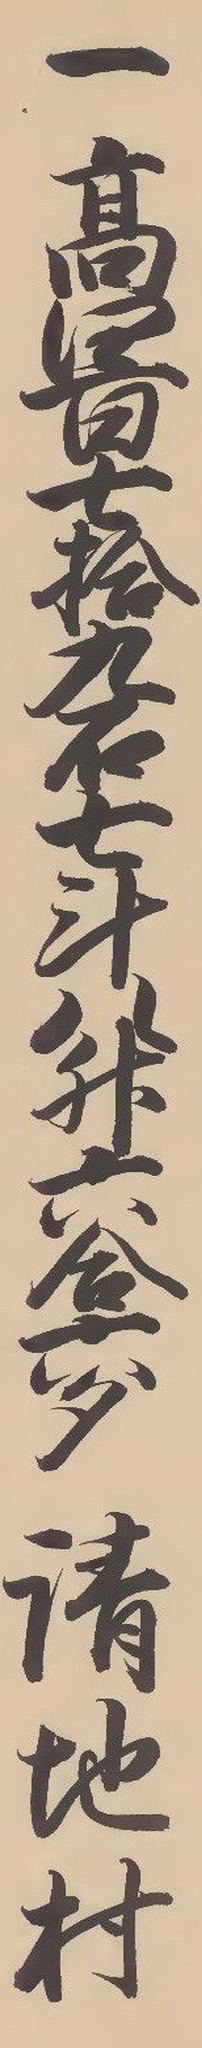一高四百七拾九石七斗八升六合六勺請地村
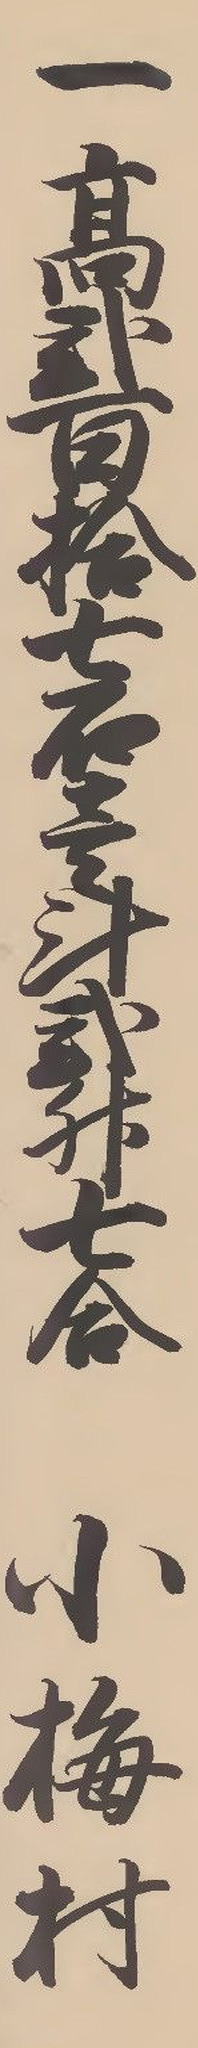一高弐百拾七石壱斗弐升七合小梅村
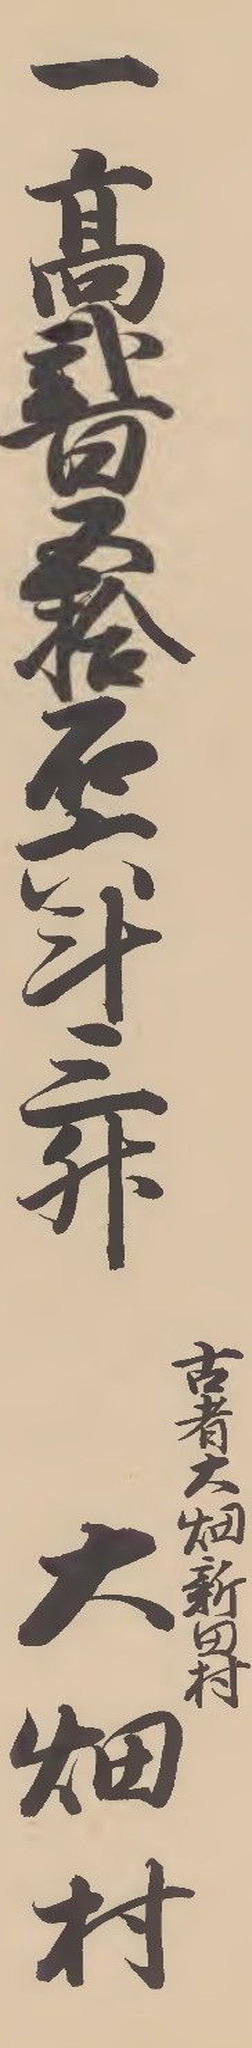一高弐百五拾石六斗三升大畑村
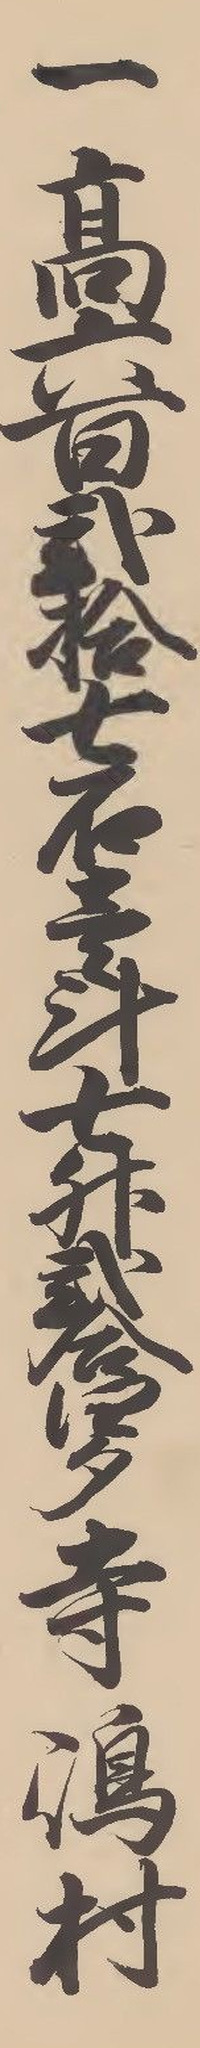一高六百弐拾七石壱斗七升弐合四勺寺嶋村
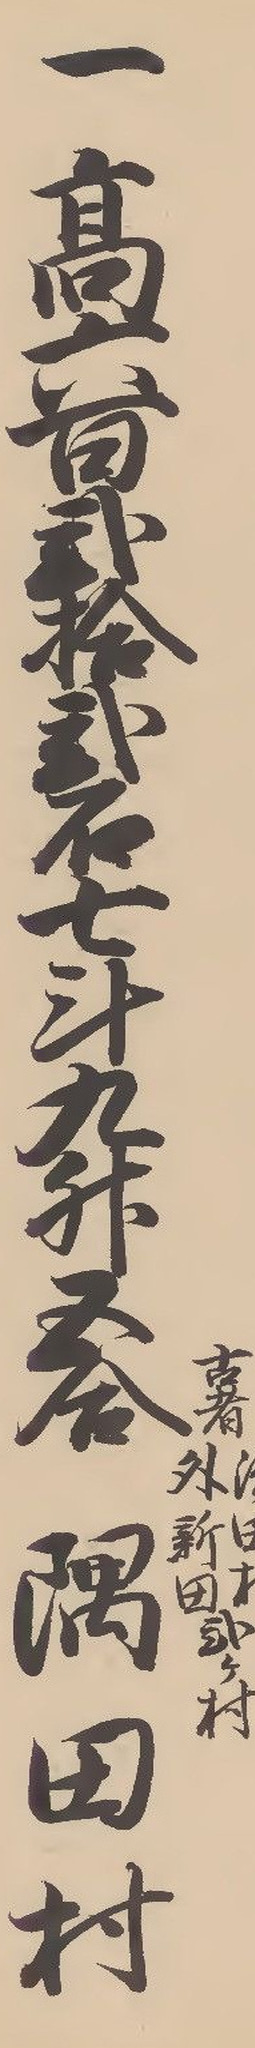一高六百弐拾弐石七斗九升五合隅田村

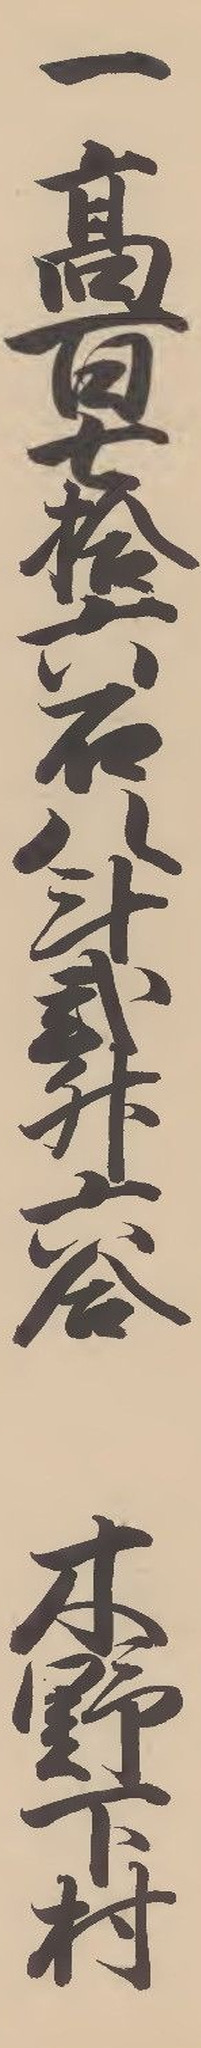一高百七拾六石八斗弐升六合木野下村
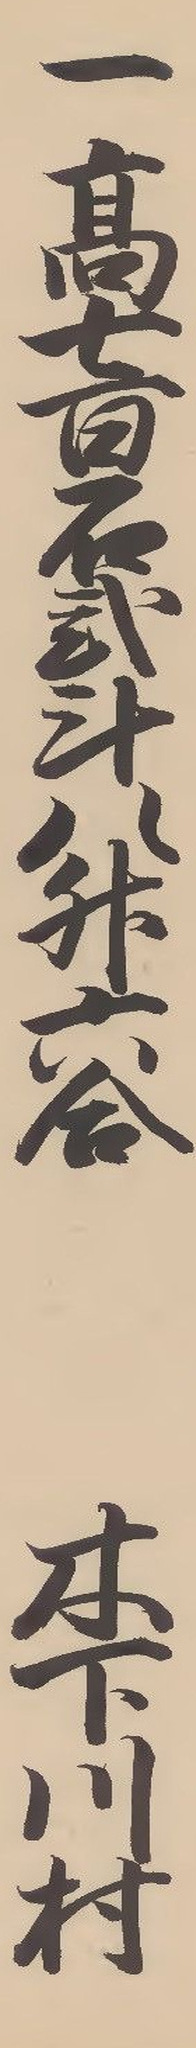一高七百石弐斗八升六合木下川村
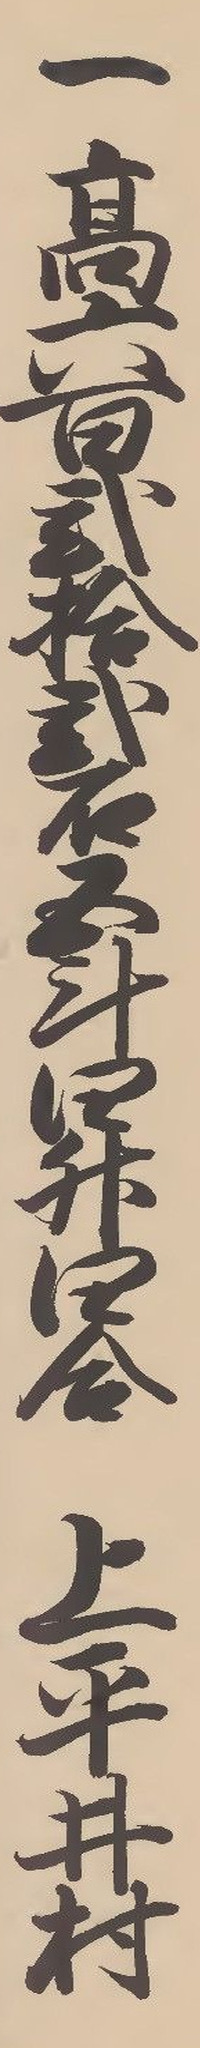一高六百弐拾弐石五斗四升四合上平井村
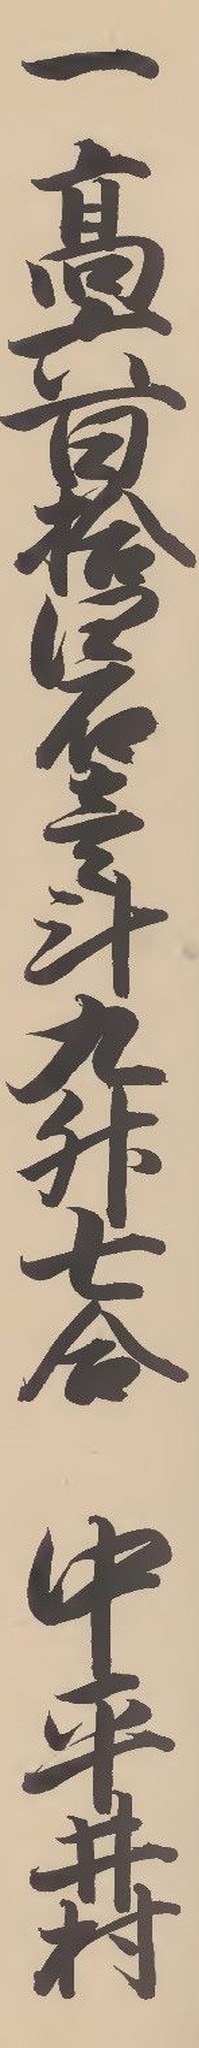一高六百拾四石壱斗九升七合中平井村
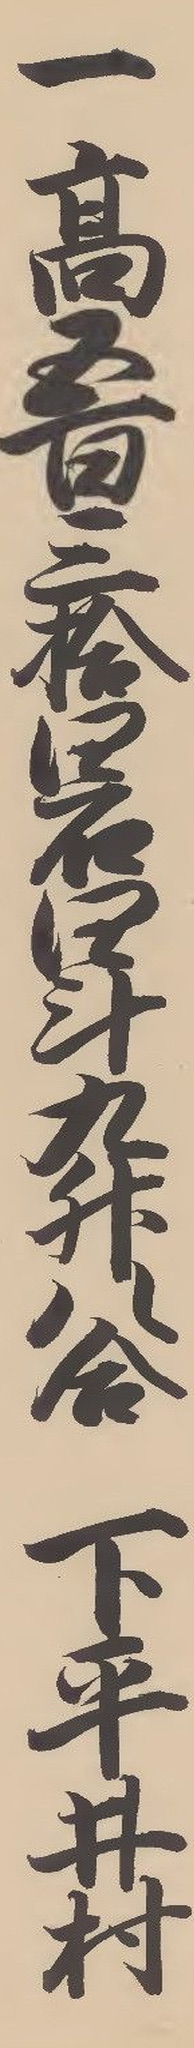一高五百三拾四石四斗九升八合下平井村
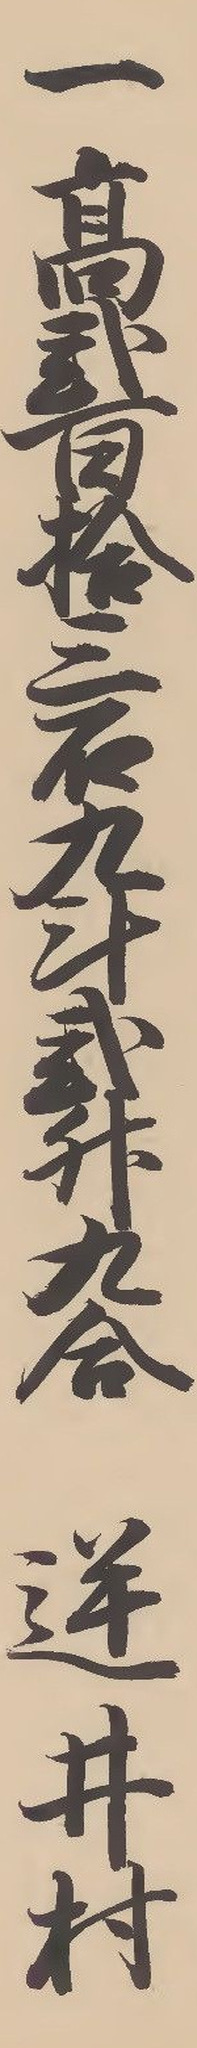一高弐百拾三石九斗弐升九合逆井村
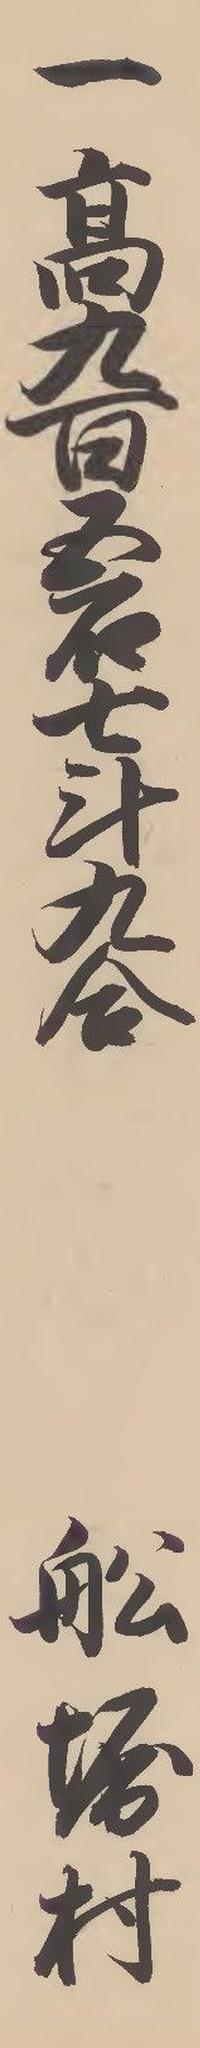一高九百五石七斗九合船堀村

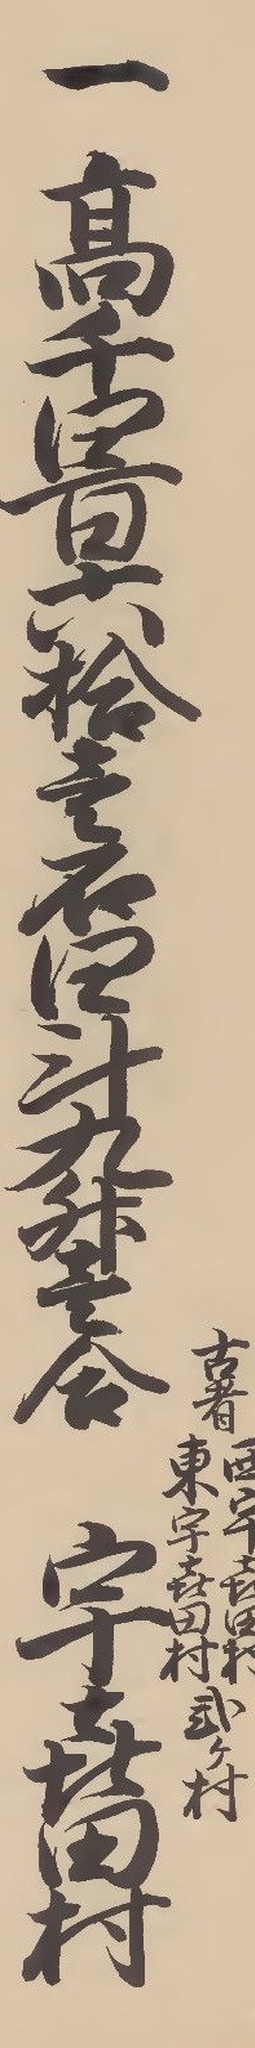一高千四百六拾壱石四斗九升壱合宇喜田村
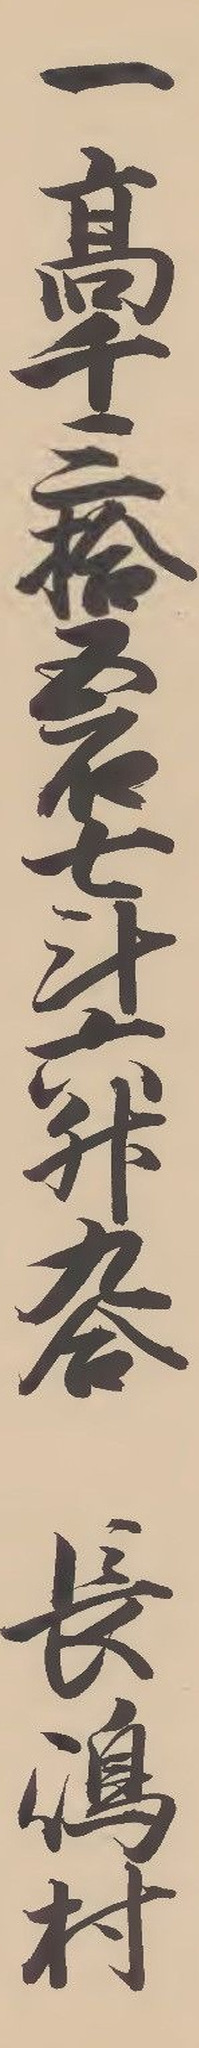一高千三拾五石七斗六升九合長嶋村
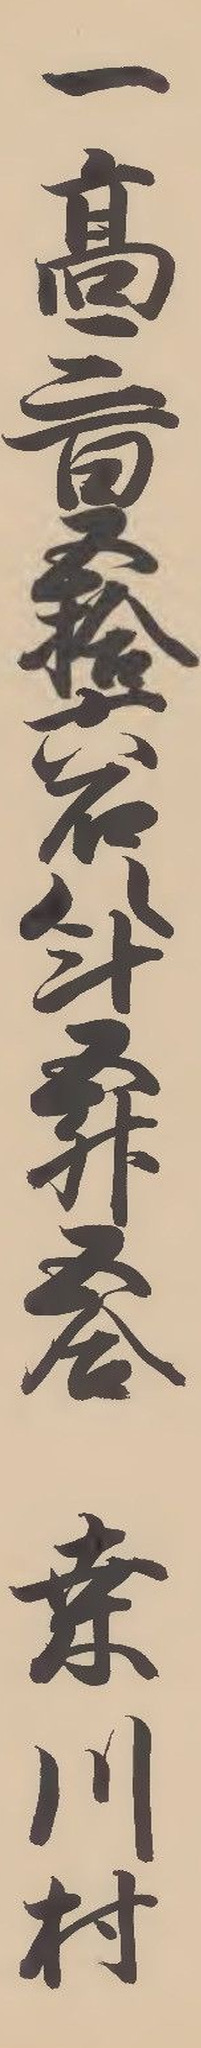一高三百五拾六石八斗五升五合桑川村
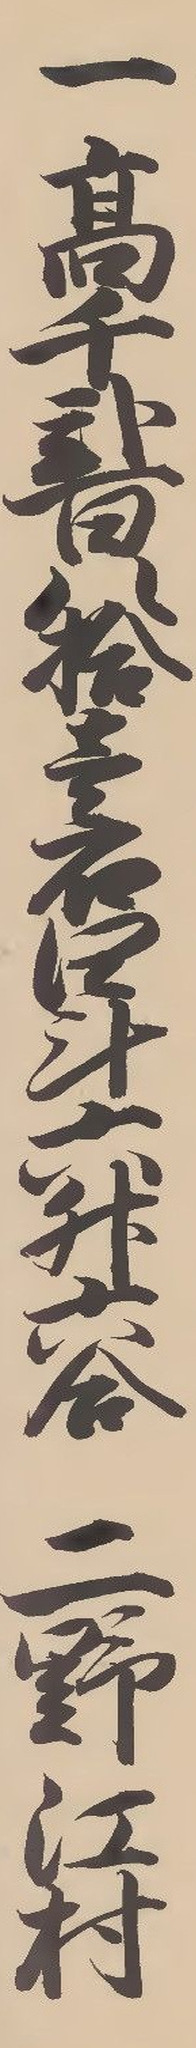一高千弐百八拾壱石四斗六升六合二野江村
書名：武蔵国郷帳　下
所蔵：国立公文書館 National Archives of Japan
